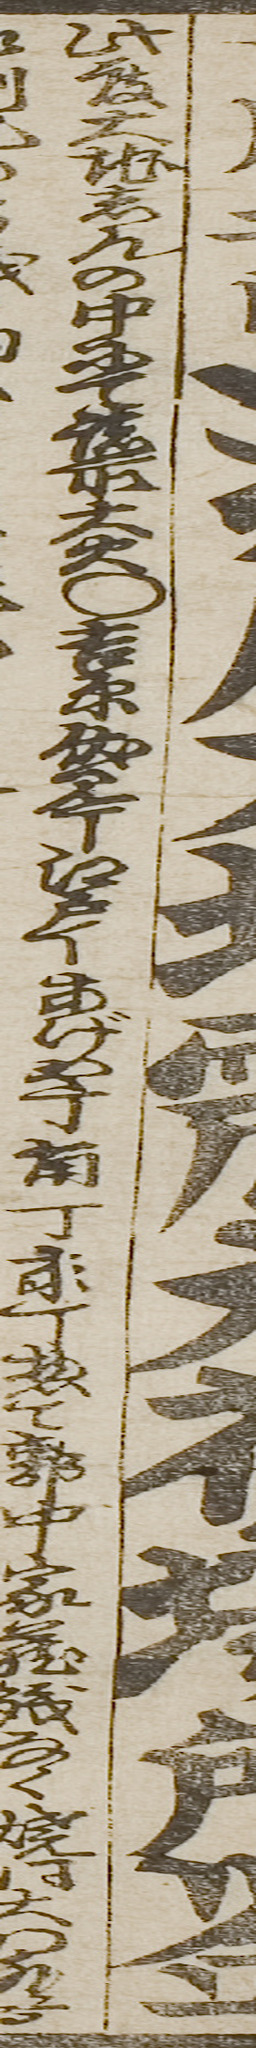此度大地震の中にて諸所大火○吉原伏見丁江戸丁あげや丁南丁京丁惣て郭中家蔵残なく焼同大門外ニ而
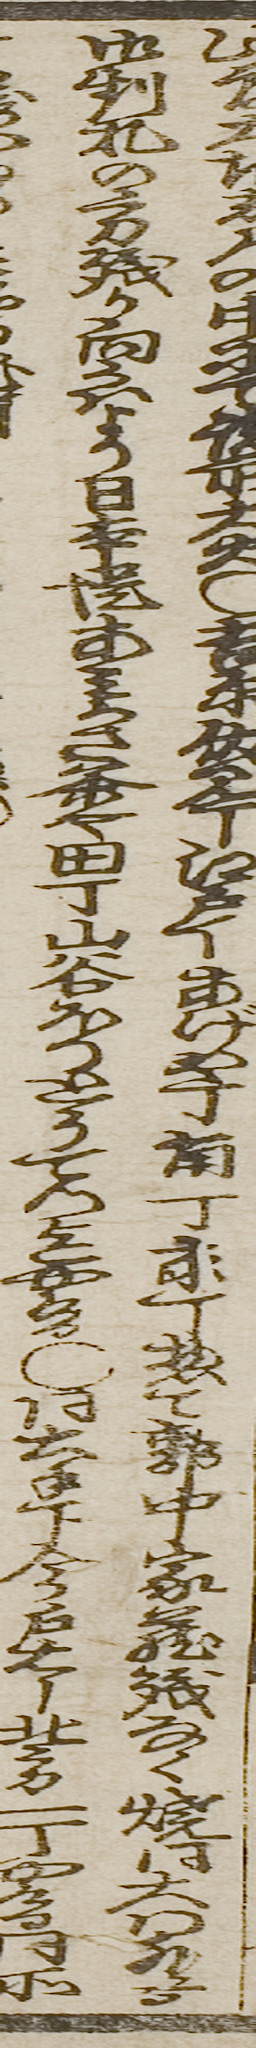御制札の方残り向かはより日本堤あみかさ茶屋田丁山谷ほりとうてつ迄やける○同土手下今戸はし北方一丁やける同所
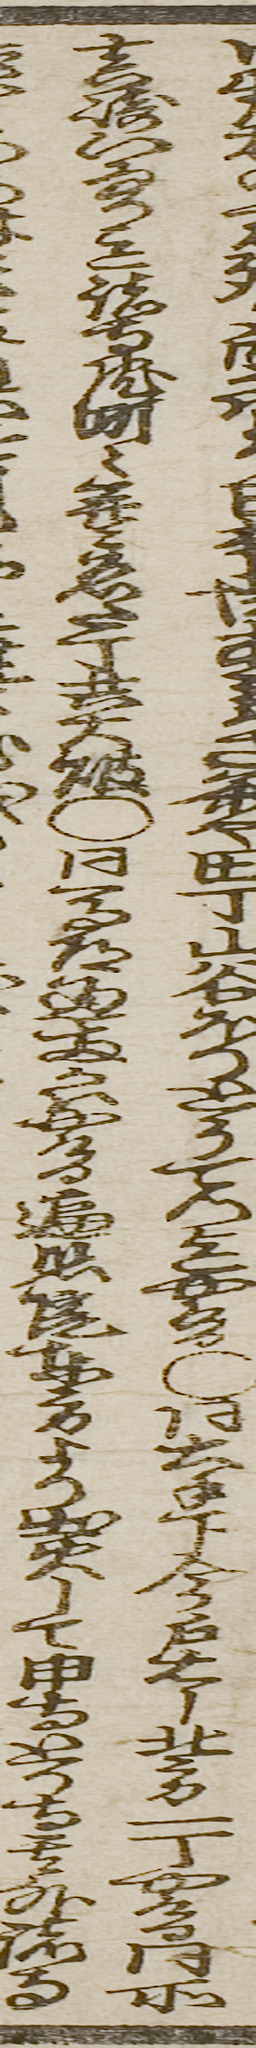真崎いなり迄諸寺院町々并にゑた丁共大破○同馬道通両かはやける遍照院東方より出火して申寺とり寺其外諸寺
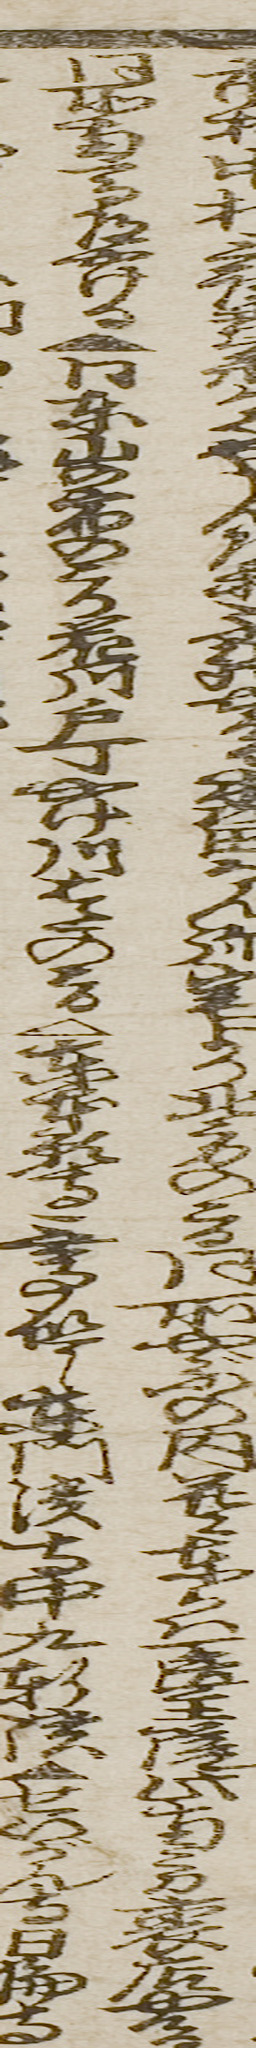同所南馬道やける▲同東山の宿のこり花川戸丁やけ川はたのこる△東本願寺無事但し東門潰寺中九軒潰▲せいがん寺日輪寺
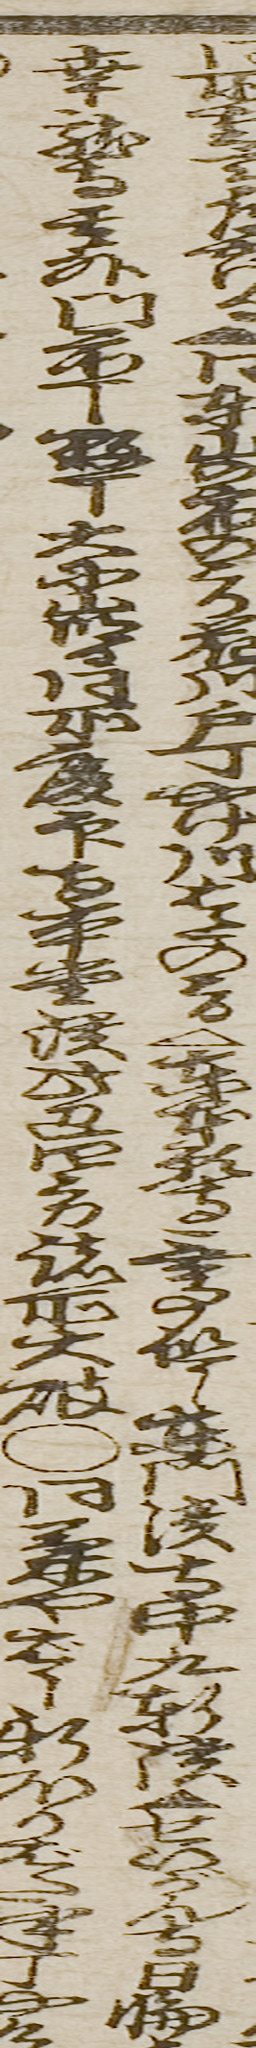幸龍寺其外門前丁数丁大に崩る同所慶印寺本堂潰此辺四方諸所大破○同菊やばし新ほりばた半丁やける
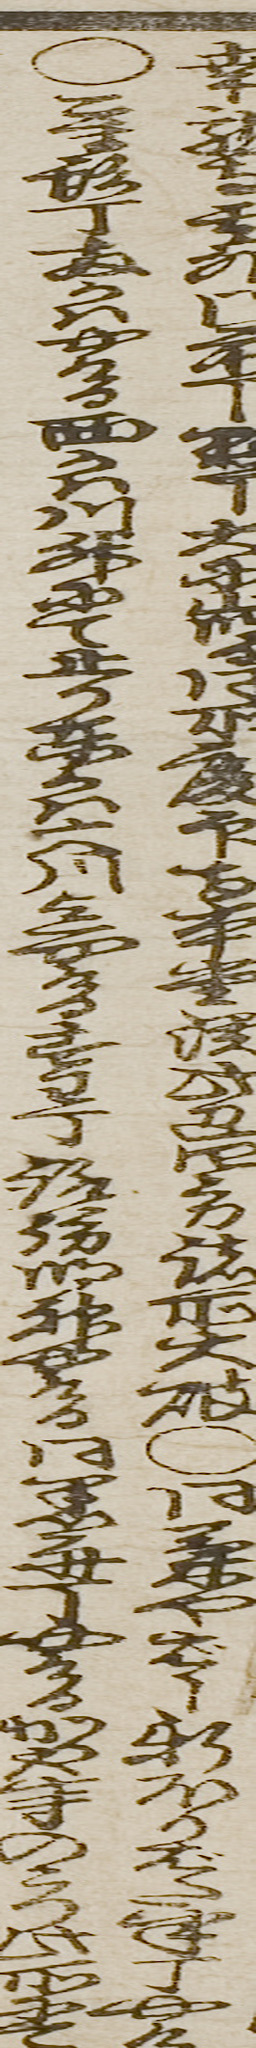○こま形丁両かはやける西かは川外にて止り東かは大川迄やけるすわ丁諏訪明神やける同黒舟丁やけるかや寺のこり此所にて止る
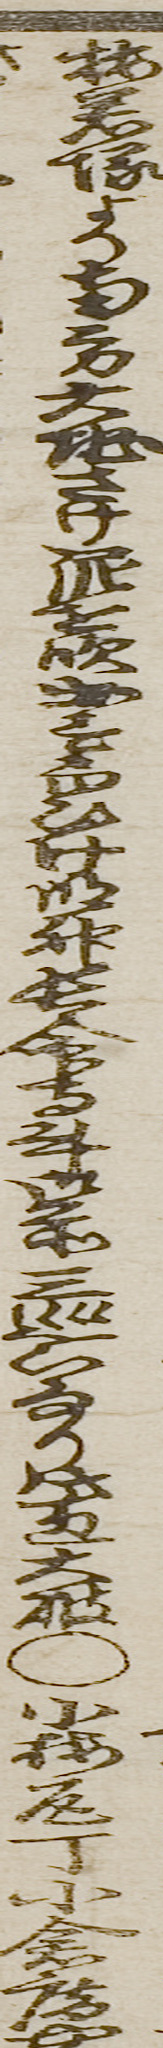梅若塚より南方大地さけ泥を吹出す白ひけ明神長命寺牛御前三廻いなり此辺大破○小梅瓦丁小倉庵やける
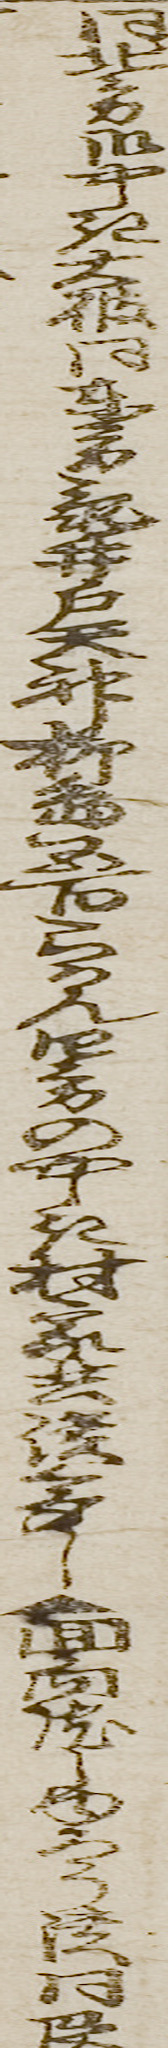同北方御やしき大破同東方亀井戸天神柳島五百らかん四方のやしき村家共潰多し▲回向院しゆろう潰同艮の方
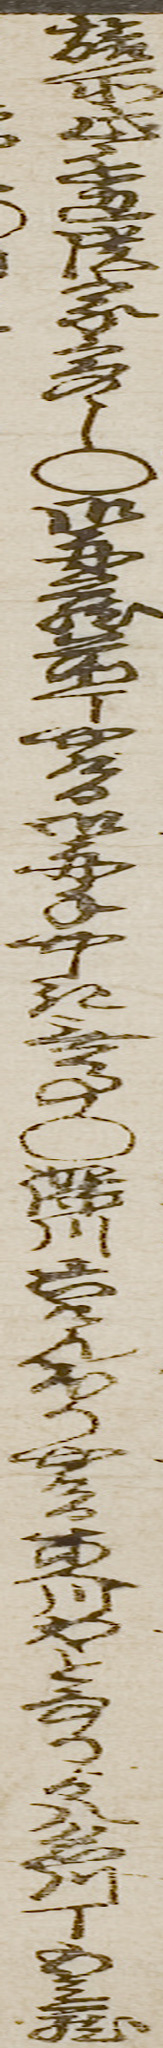旅所此近辺潰家多し○御舟蔵前丁やける御舟手やしき無事○深川六けんほりやけるあへ川となりゟ八名川丁もみ蔵
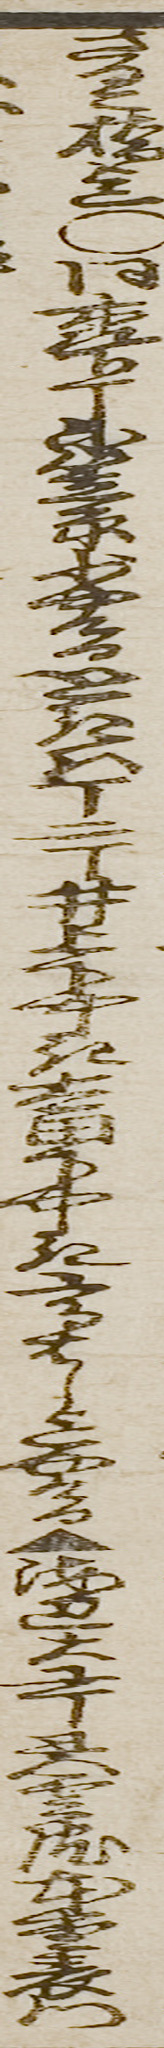さるこ橋迄○同森下丁小笠原少やけるときは丁二丁井上下やしき太田下やしき高はし迄やける▲海辺大工丁霊雲院本堂表門
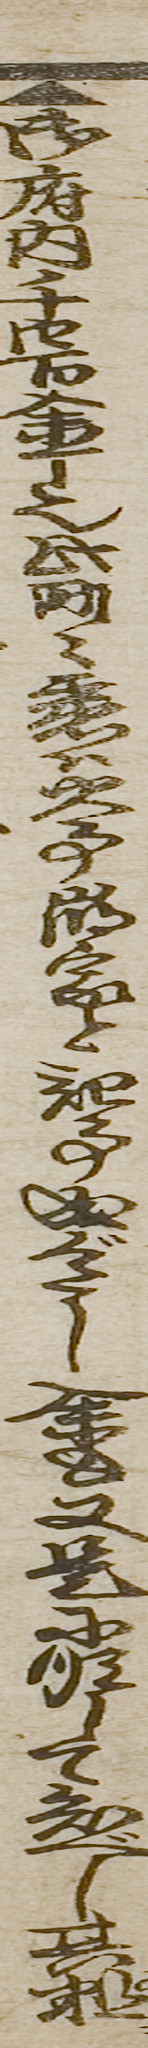▲御府内千四百余丁也此町々悉は火事崩家と記事成がたし余も又是に順して知べし其粗
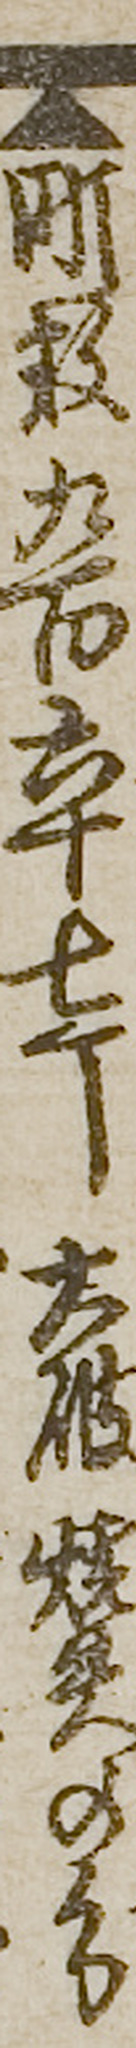▲町数九百六十七丁大破焼失の分
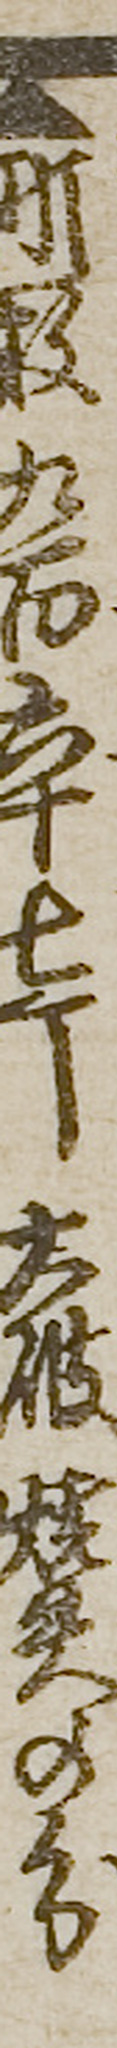▲町数九百六十七丁大破焼失の分
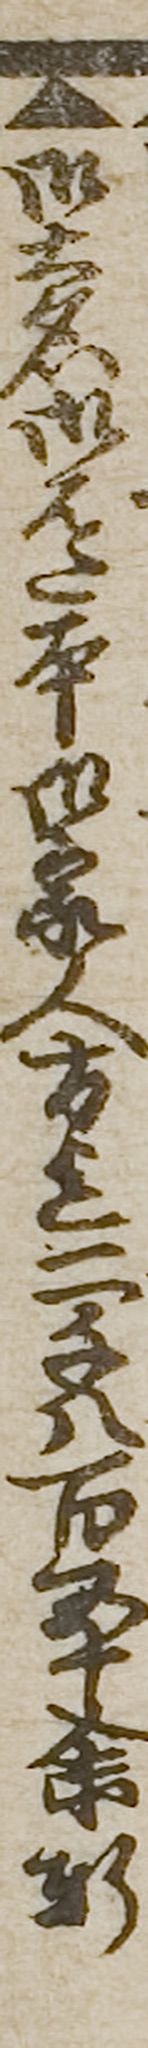▲御大名御はた本御家人方迄二千八百五十余軒
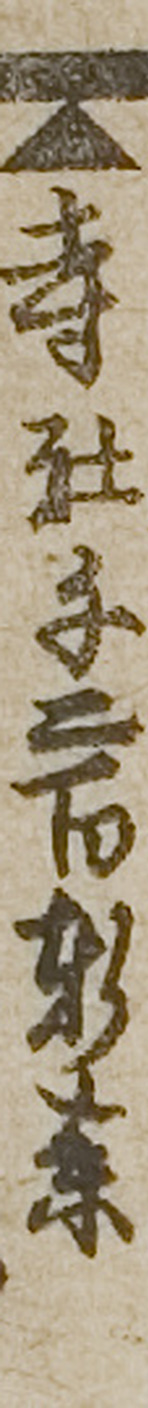▲寺社千二百軒余
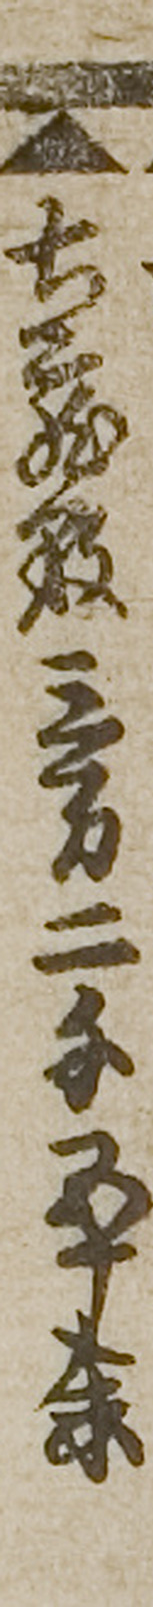▲土蔵数三万二千五十余
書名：安政二年十月二日江戸大地震大花場所鑒
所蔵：東京大学総合図書館 General Library in the University of Tokyo, JAPAN
